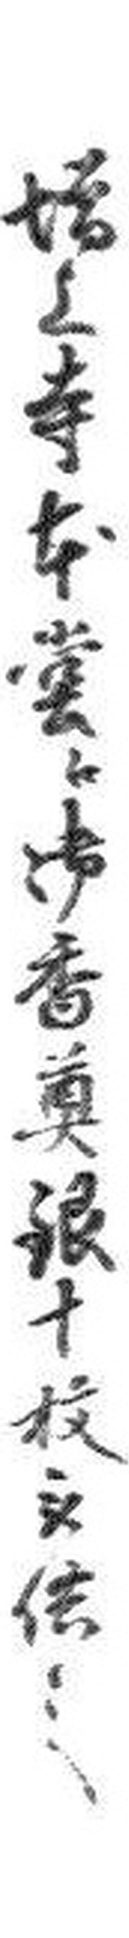増上寺本堂江御香奠銀十枚被供之
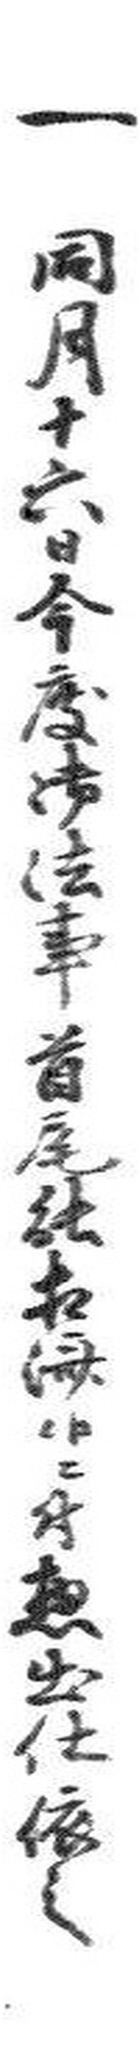一同月十六日今度御法事首尾能相済候ニ付惣出仕依之
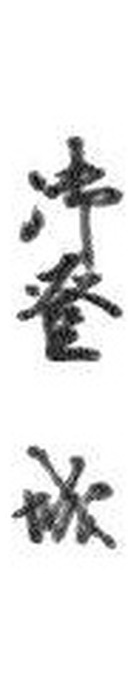御登城

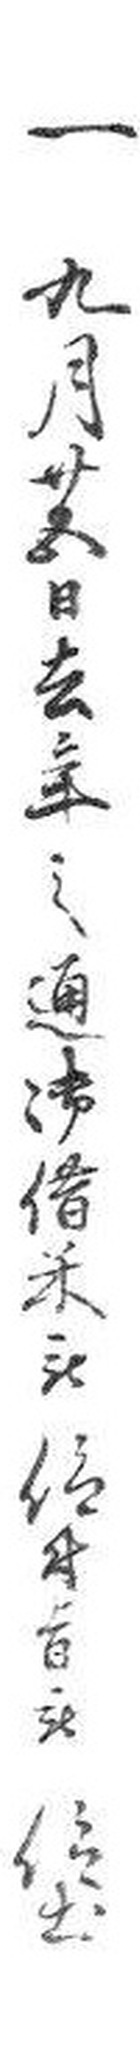一九月廿五日去年之通御借米被仰付旨被仰出
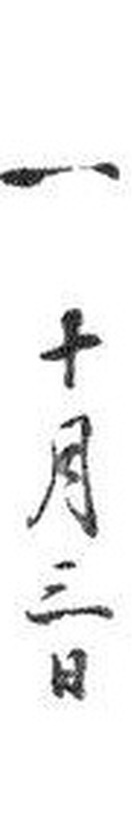一十月三日
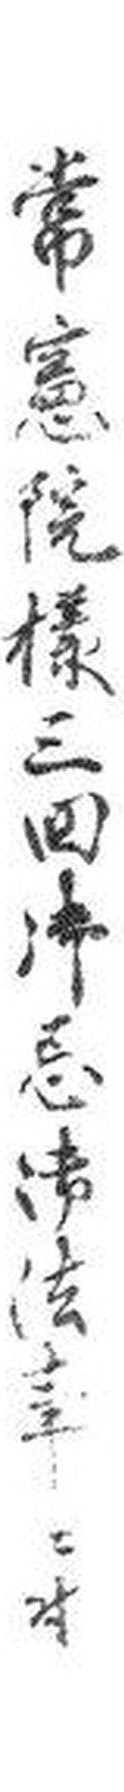常憲院様三回御忌御法事ニ付
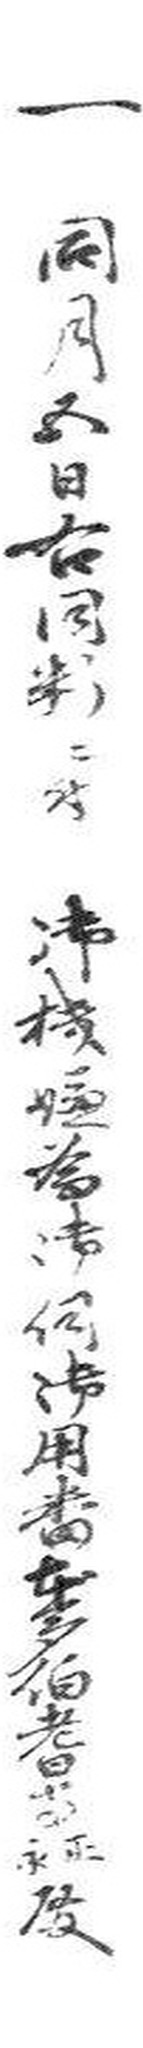一同月五日右同断ニ付御機嫌為御伺御用番本多伯耆守正永殿
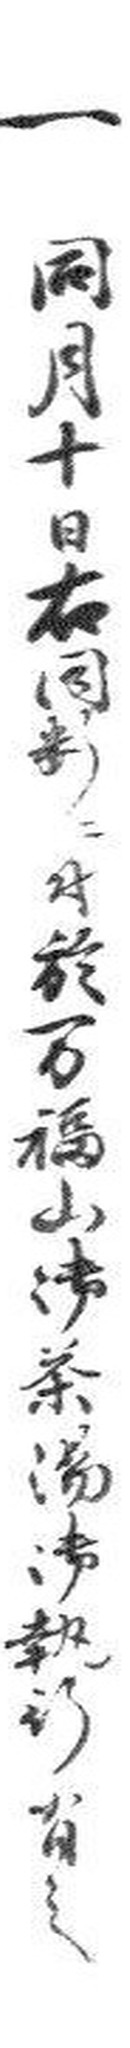一同月十日右同断ニ付於万福山御茶湯御執行有之
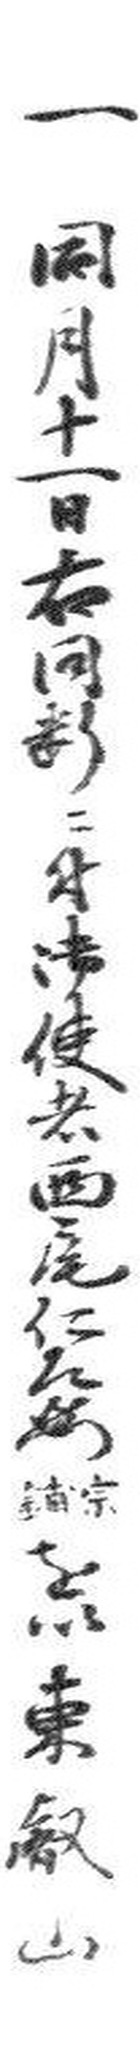一同月十一日右同断ニ付御使者西尾仁左衛門宗鋪を以東叡山
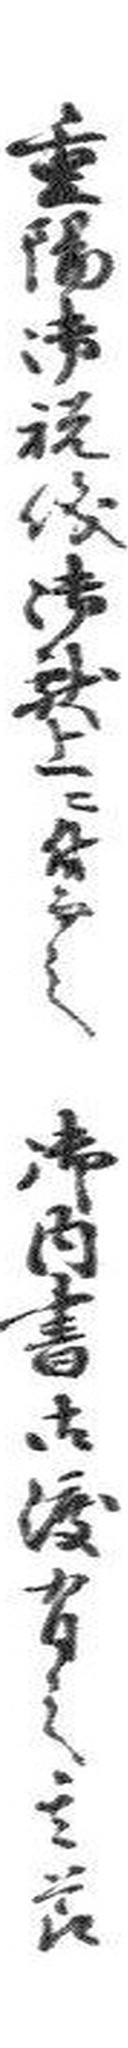重陽御祝儀御献上ニ付而之御内書御渡有之其節
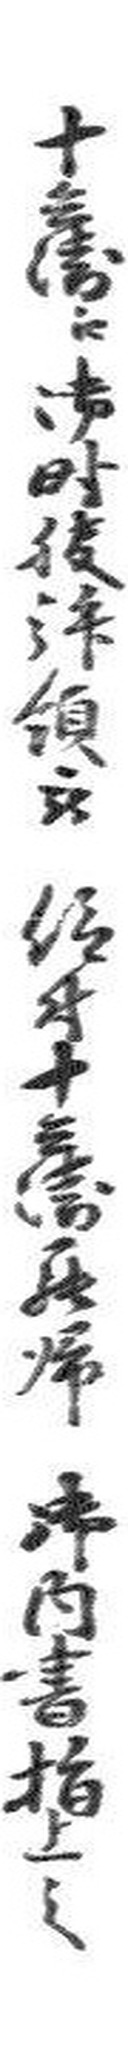十兵衛江御時服拝領被仰付十兵衛罷帰御内書指上之
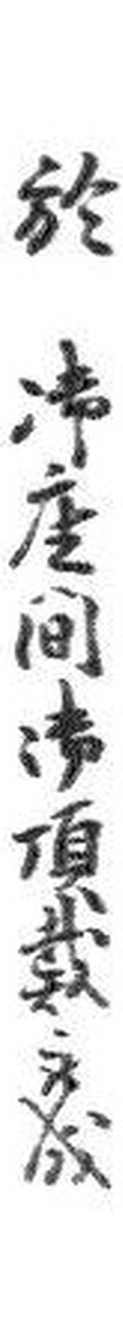於御座間御頂戴被成
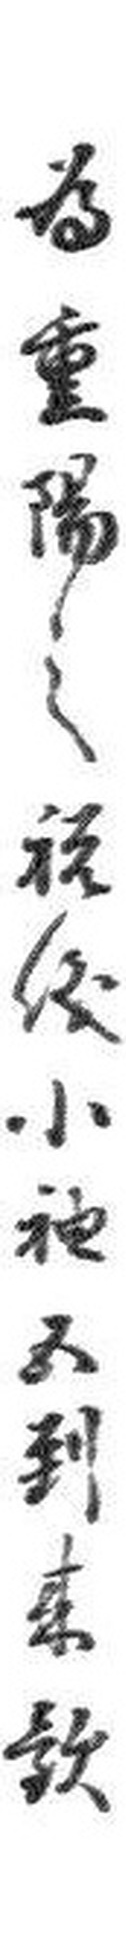為重陽之祝儀小袖五到来歓
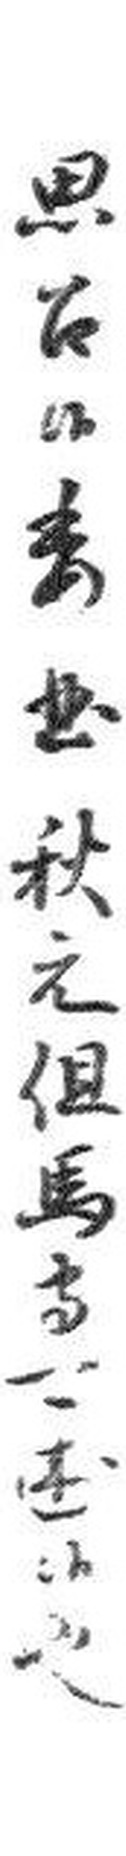思召候委曲秋元但馬守可述候也
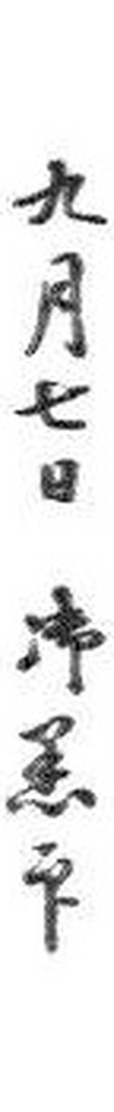九月七日御黒印
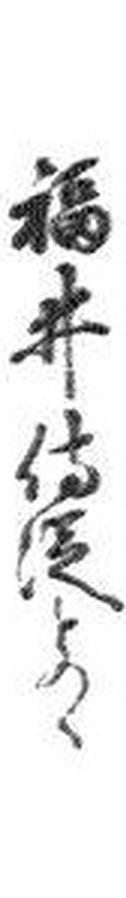福井侍従とのへ
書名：家譜 二十八 吉邦公 従宝永七年七月五日到正徳元年十二月
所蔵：福井県文書館 Fukui Prefectural Archives
